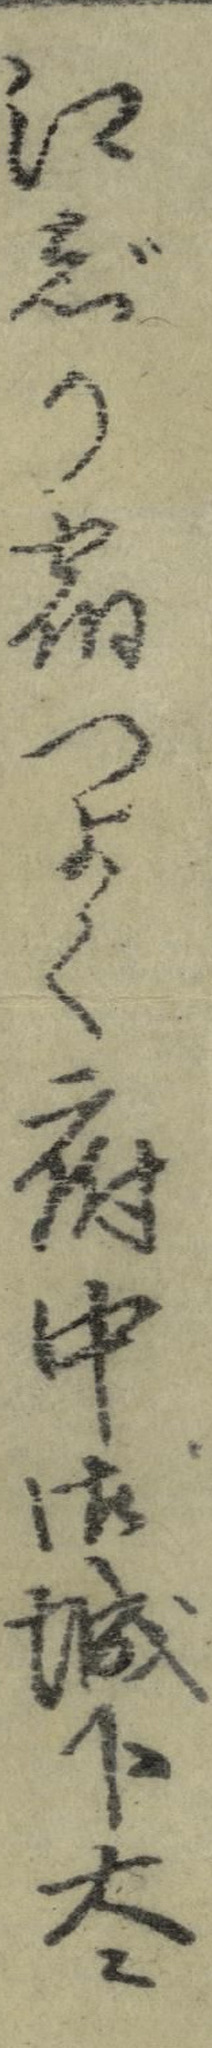えじり宿つよく府中御城下大ニ
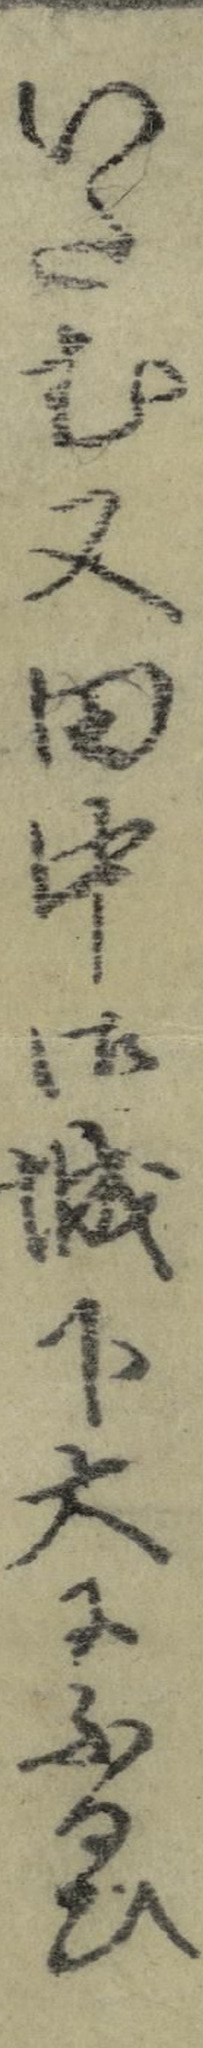いたむ又田中御城下大にふるひ
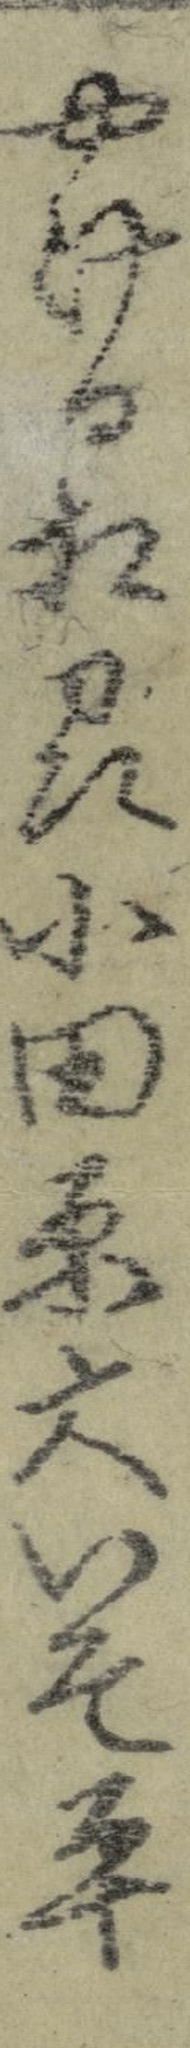やける相州小田原大いそ平
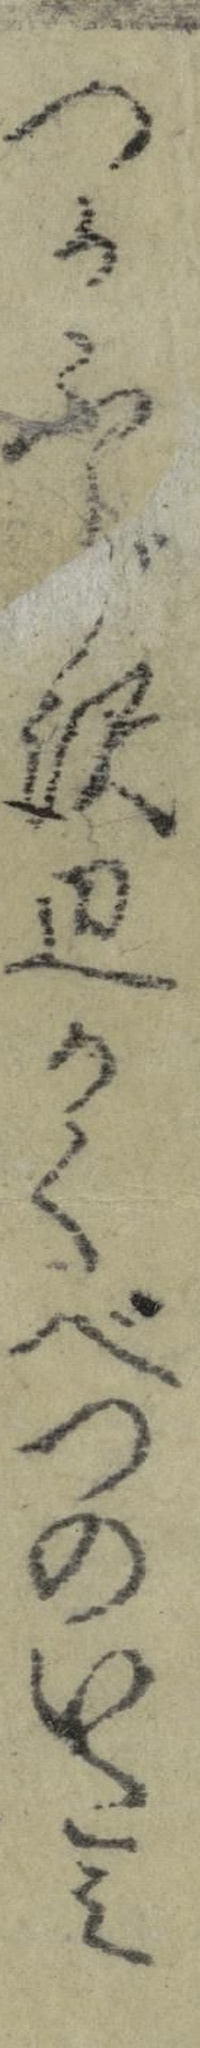つかふじ沢辺かくべつのいたみ
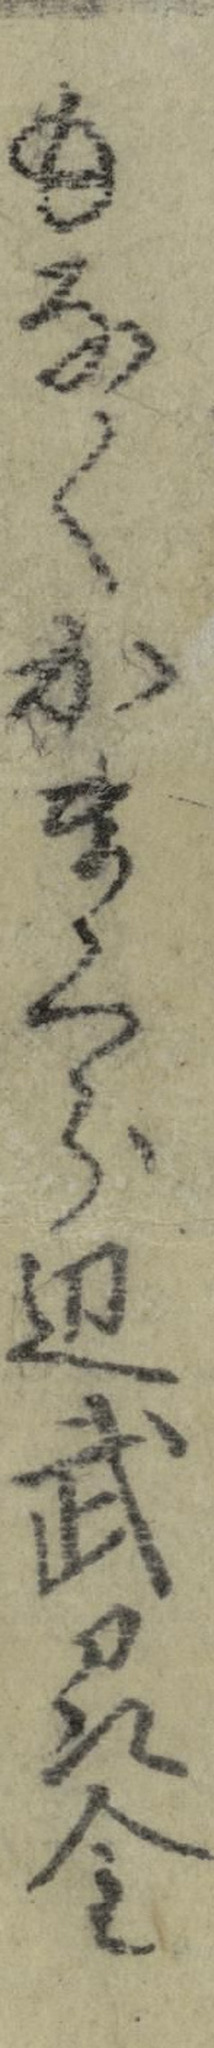もなくかまくら辺武州金
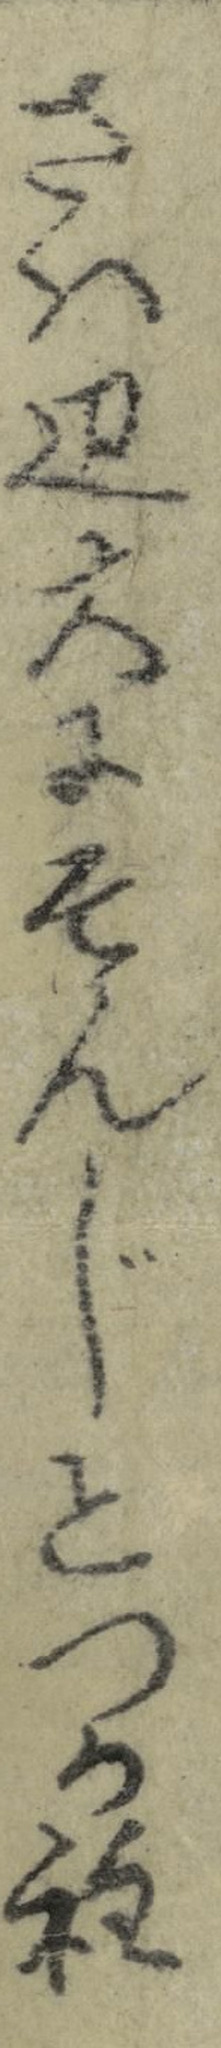さは辺大にそんじとつか程
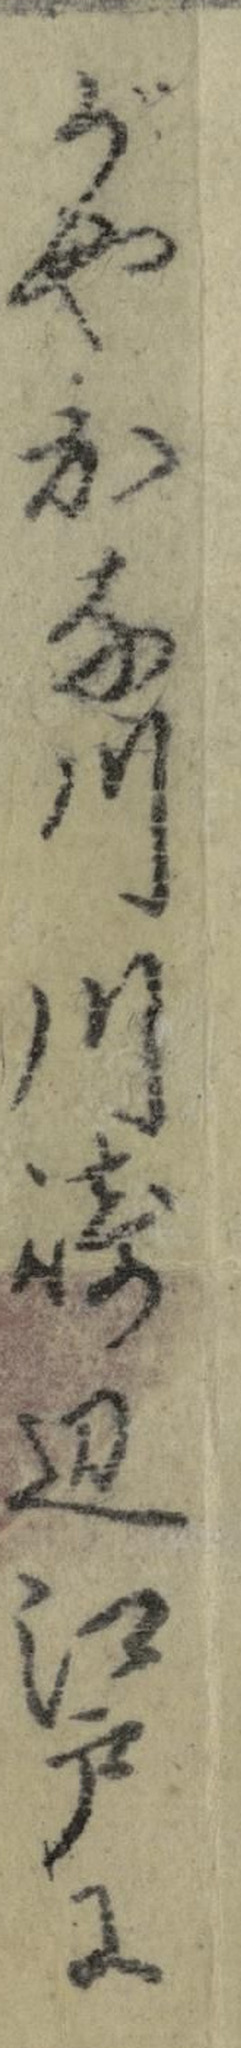がやかな川川崎辺江戸に
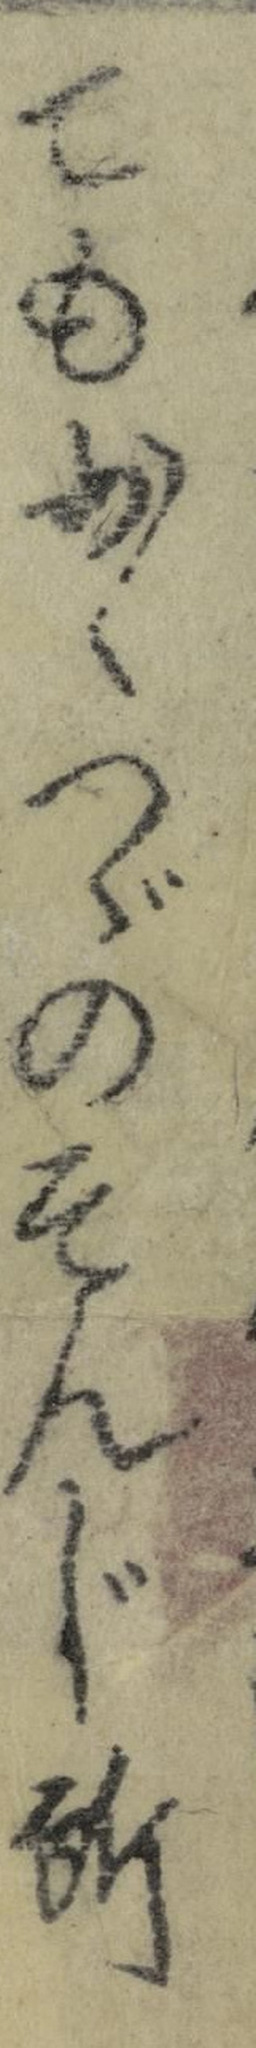ても少ゝつゞのそんじ所
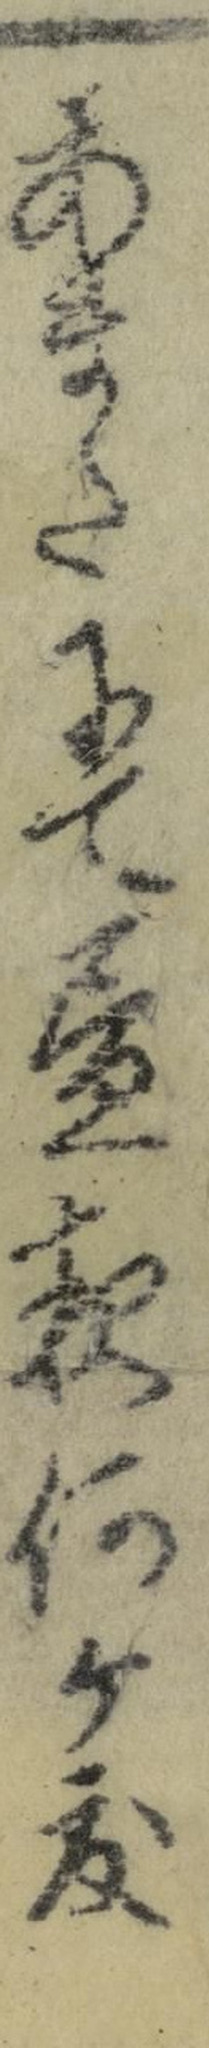あまたにて昼夜何ケ度
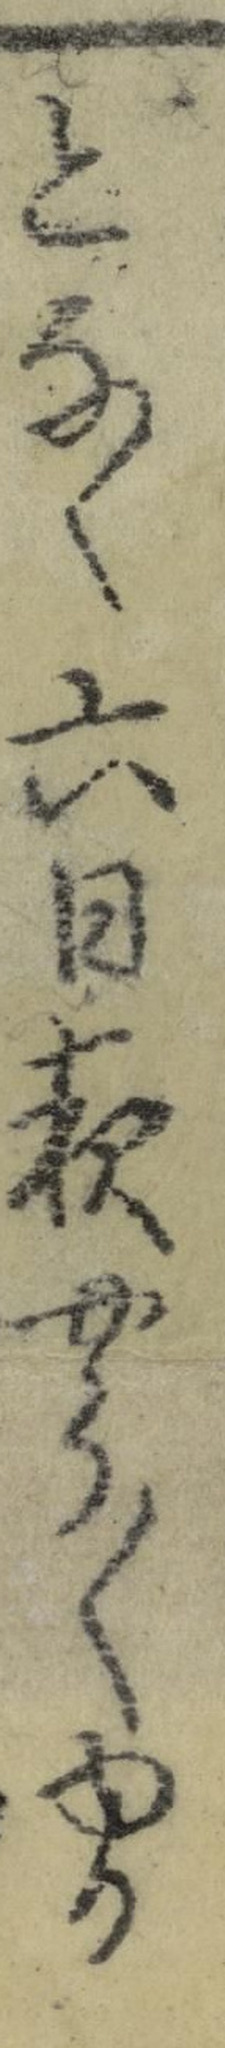となく六日夜やう〳〵ゆり
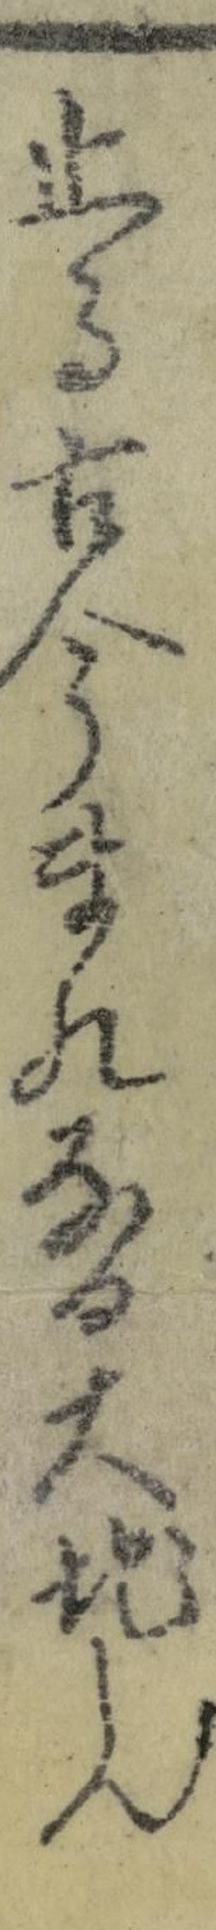止る古今まれなる大地しん
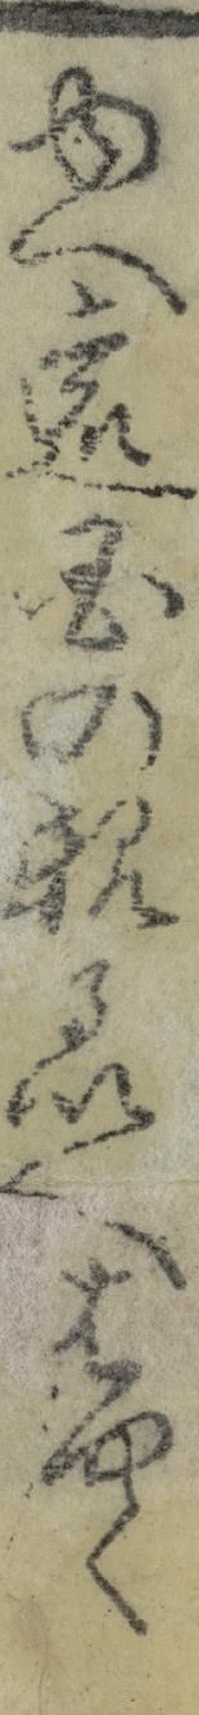ゆへ遠国の親るいへはやく
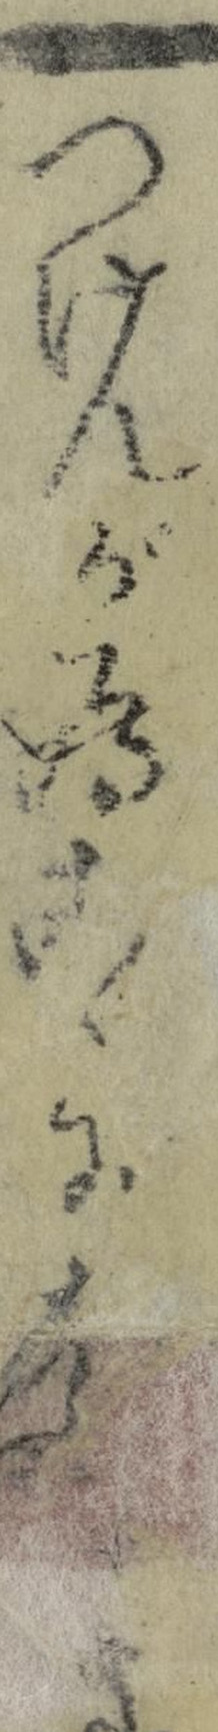つけんが為こゝにしるす
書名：[安政東南海地震に関する瓦版]
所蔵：東京大学地震研究所図書室 Earthquake Research Institute Library, The University of Tokyo, JAPAN
